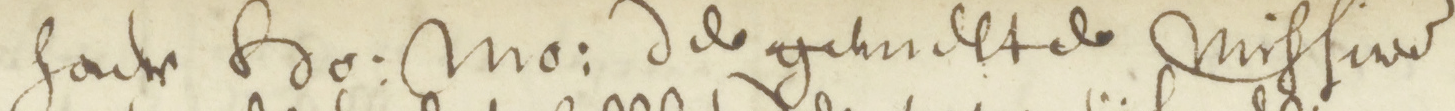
haer Ho:Mo: de gemelte missive
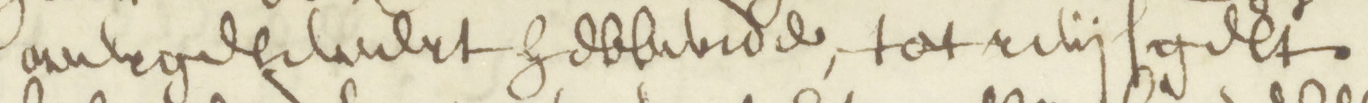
overgelevert hebbende, tot reijsgelt
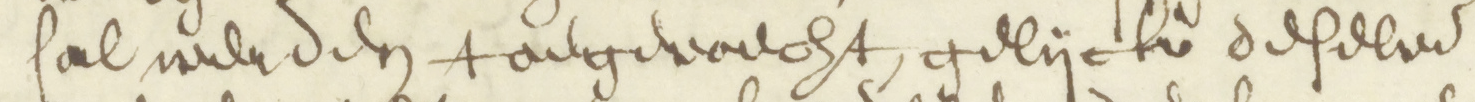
sal werden toegevoecht, gelijck deselve
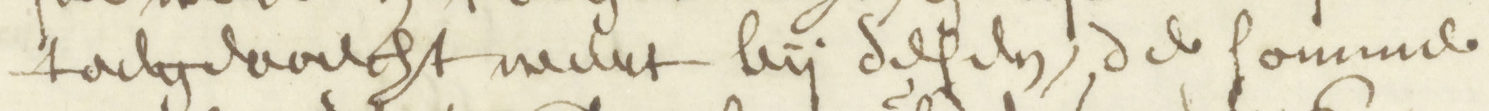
toegevoecht wert bij desen, de somme
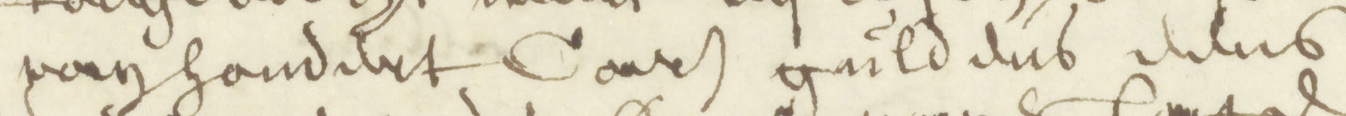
van hondert Car guldens eens
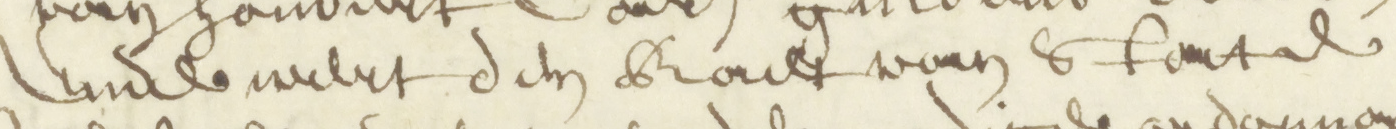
ende wert den Raet van State
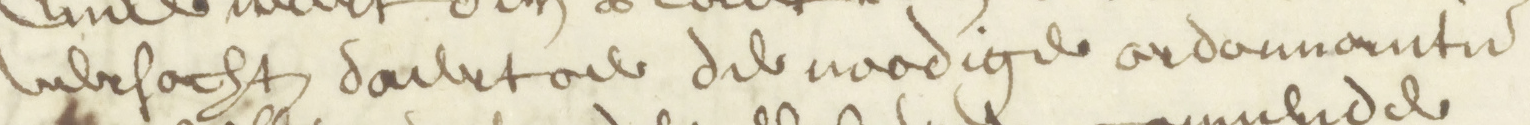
versocht, daertoe de noodige ordonnantie
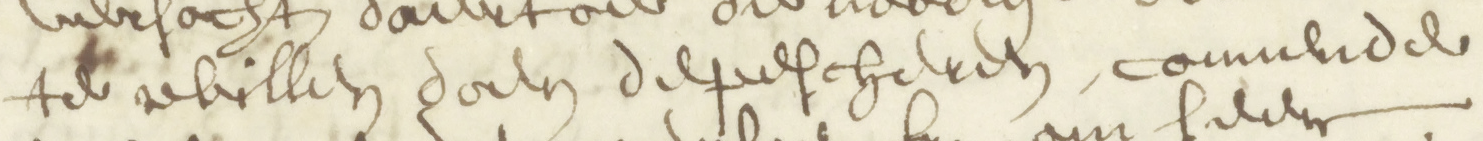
te willen doen depescheren, connende
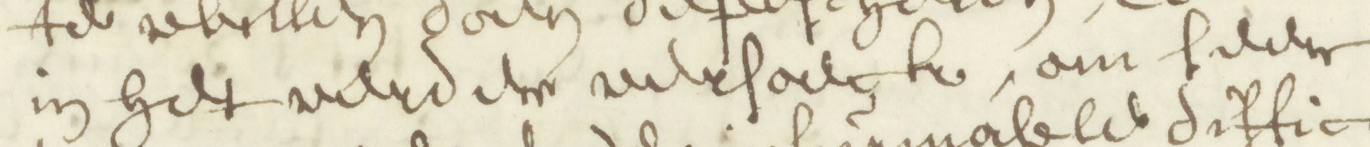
in het verder versoeck, om seer
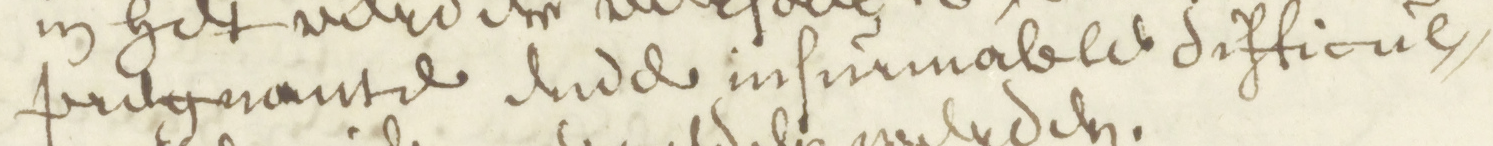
pregnante ende insurmable difficul„
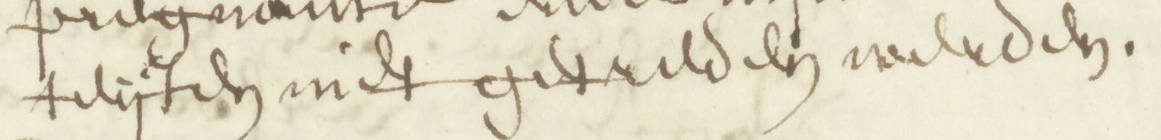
teijten niet getreden werden.
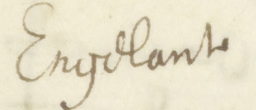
Engelant
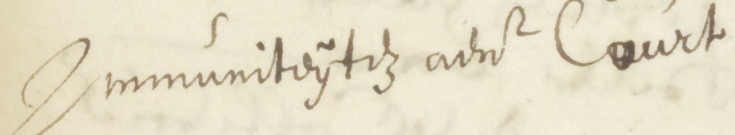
Immuniteijten aen Court
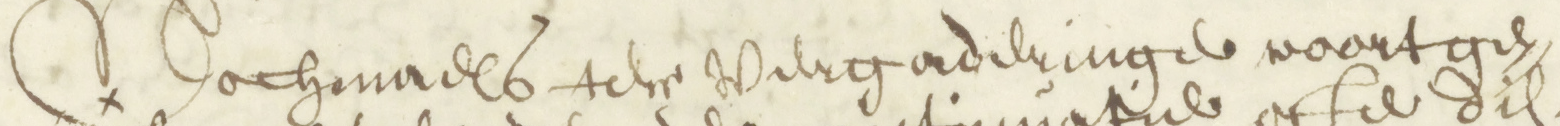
Nochmaels ter vergaderinge voortge,
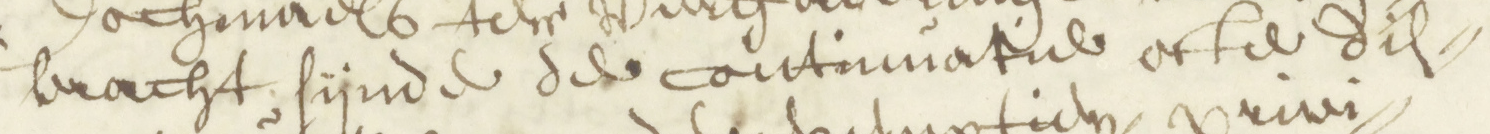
bracht sijnde de continuatie ofte dis„
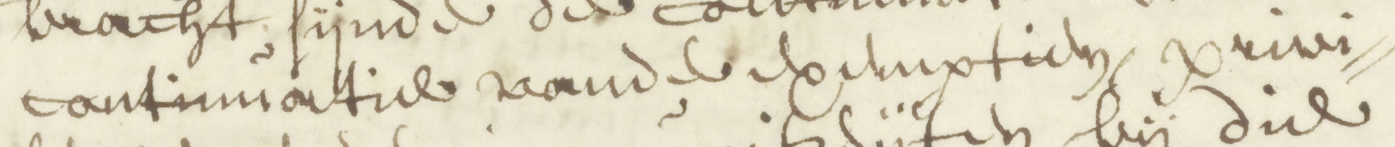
continuatie vande exemptien, privi,,
